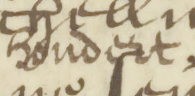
,,Hondert.
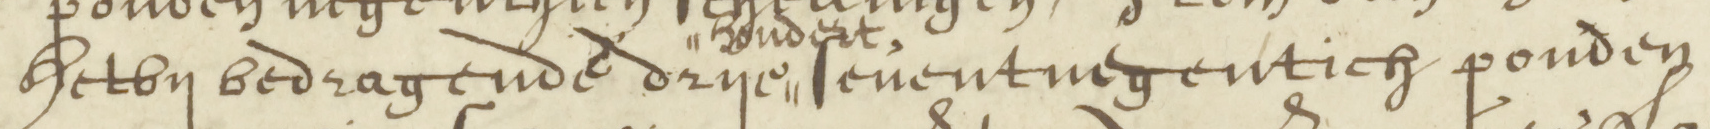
Hetby bedragende drye,, seuentnegentich ponden
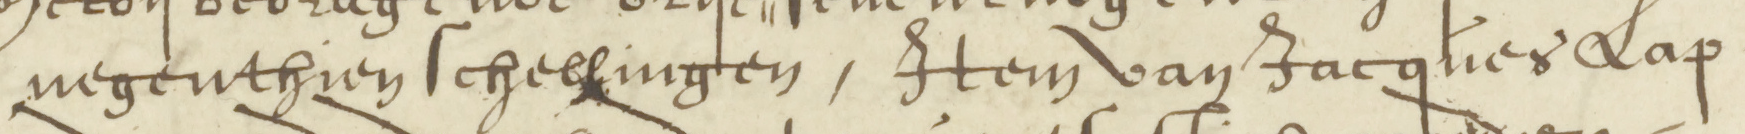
negenthien schellingen, Item van Jacques Lap
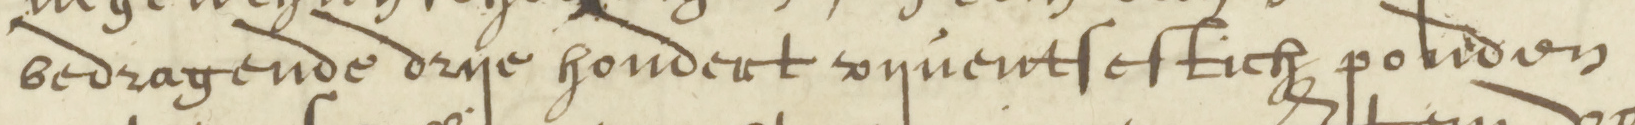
bedragende drye hondert vyuentsestich ponden
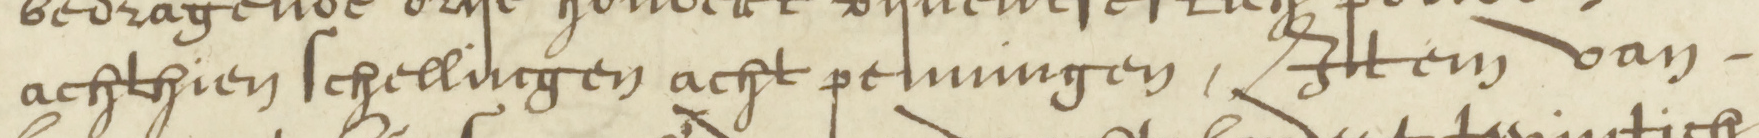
achthien schellingen acht penningen, Item van
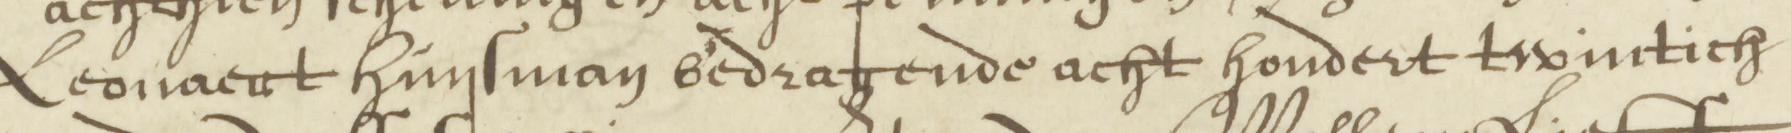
Leonaert Huysman bedragende acht hondert twintich
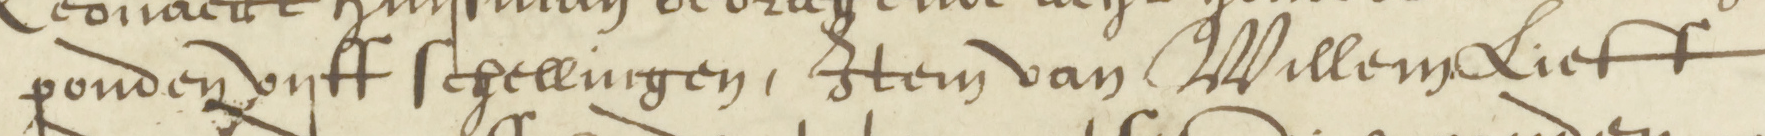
ponden vyff schellingen, Item van Willem Lieff
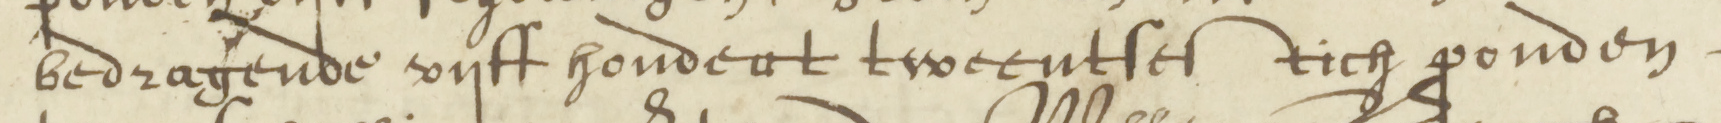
bedragende vijff hondert tweentsestich ponden
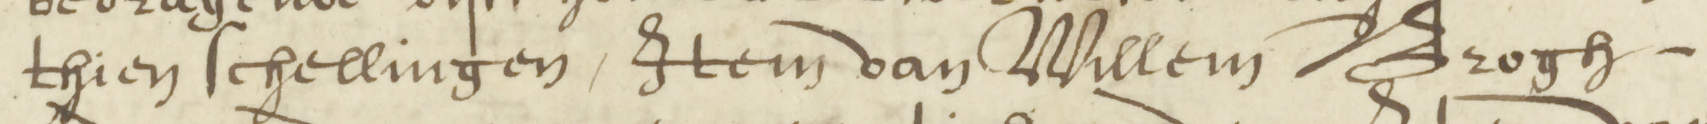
thien schellingen, Item van Willem Brogh-
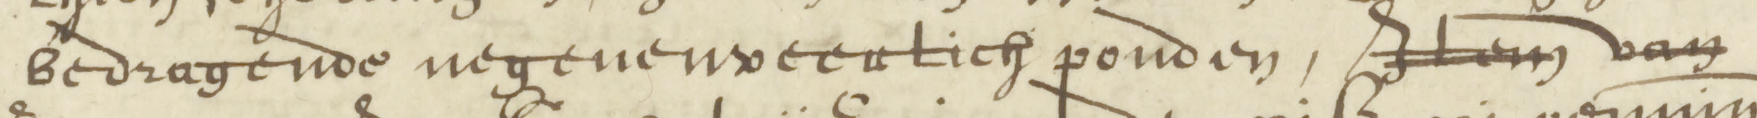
bedragende negenenveertich ponden, Item van
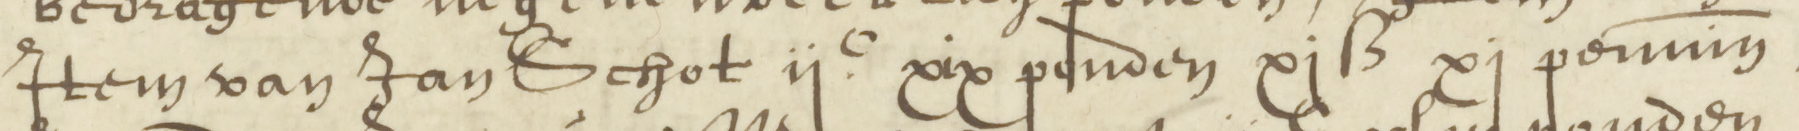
item van Jan Schot iic xix ponden xiß xi pennin
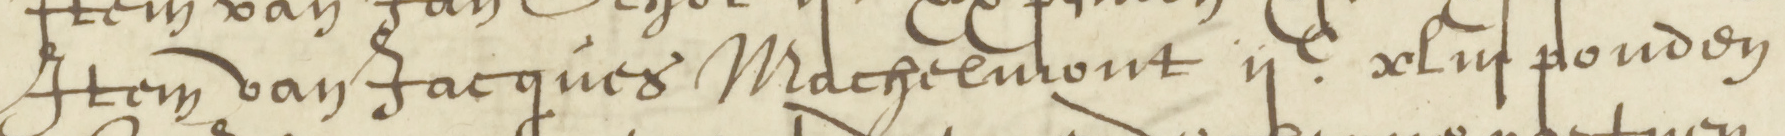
Item van Jacques Machelmont ijc. xliij ponden
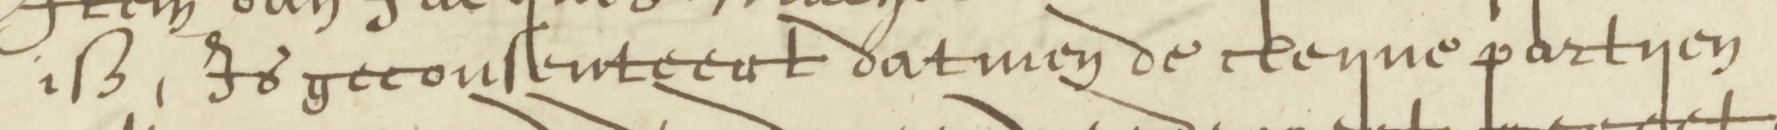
iß, Is geconsenteert dat men de cleyne partyen
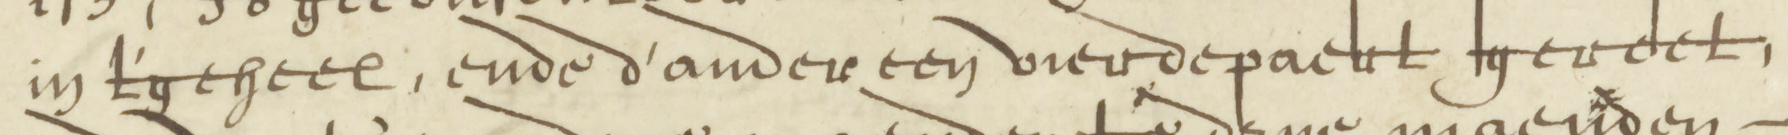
in tgeheel, ende d'ander een vierdepaert gereet,
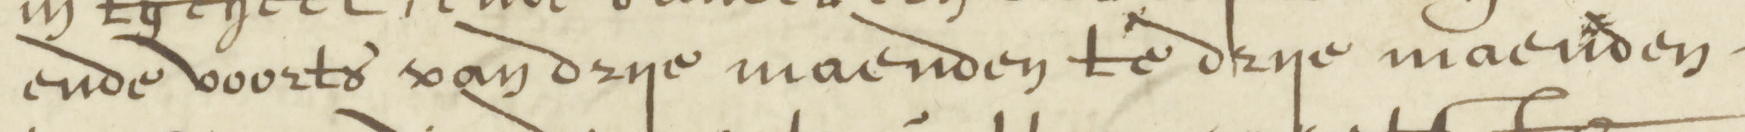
ende voorts van drye maenden te drye maenden
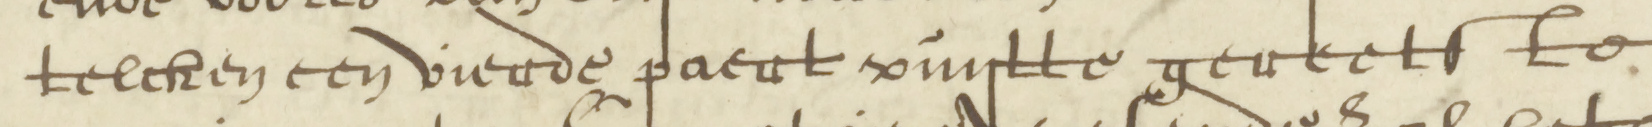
telcken een vierde paert vuytte gereetste
